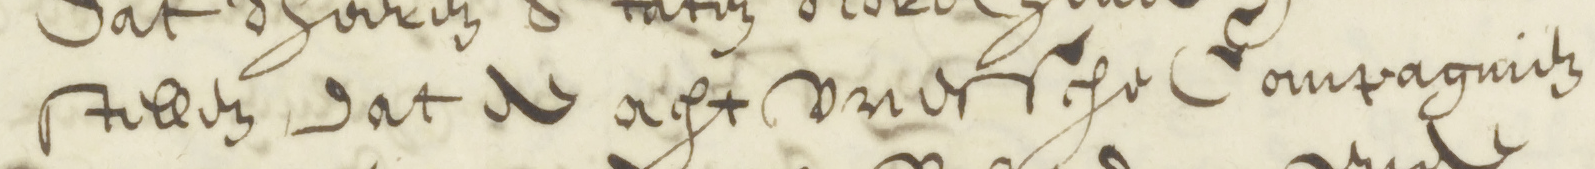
stellen, dat de acht Vriessche Compagnien
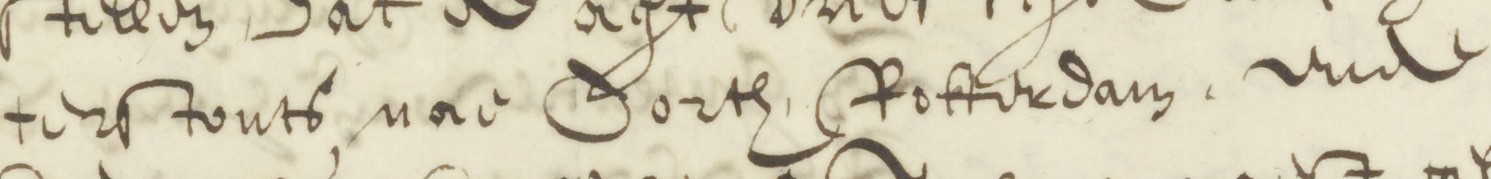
terstonts, nae Dorth, Rotterdam, ende
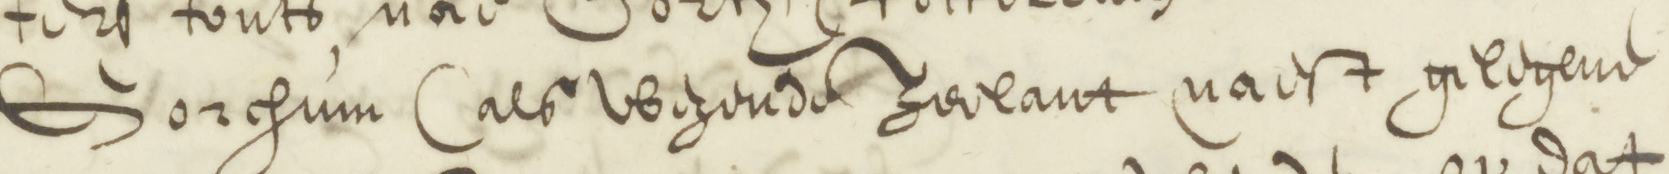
Gorchum (als wezende Zeelant naest gelegene
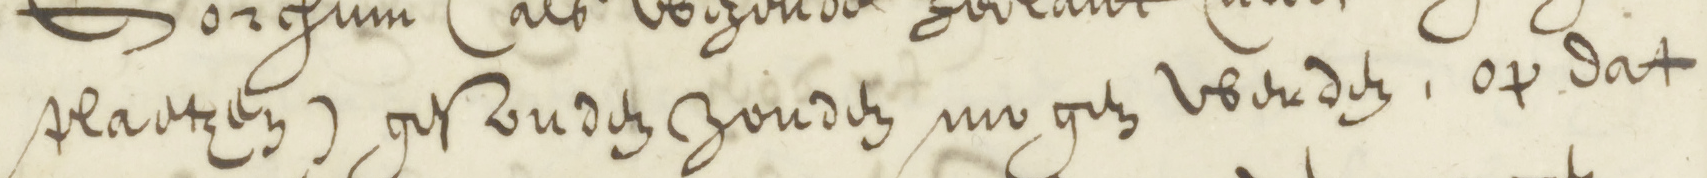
plaetzen) gesonden zouden mogen werden, op dat
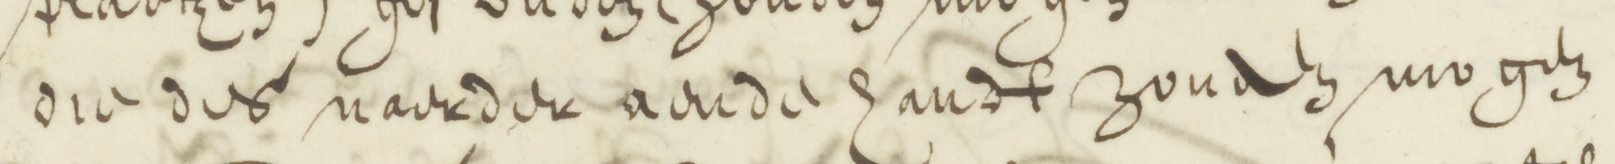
die des naerder aende handt zouden mogen
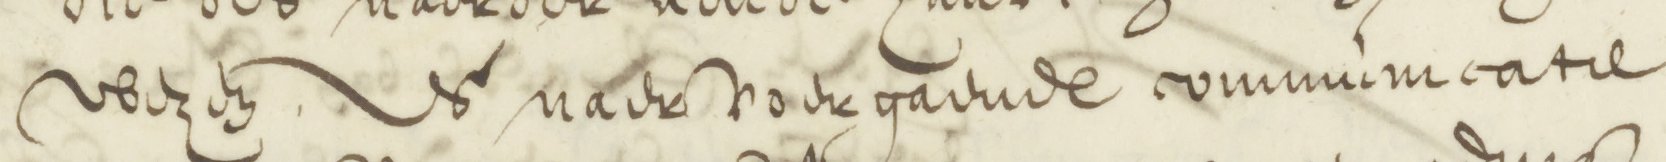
wezen. Es naer voergaende communicatie
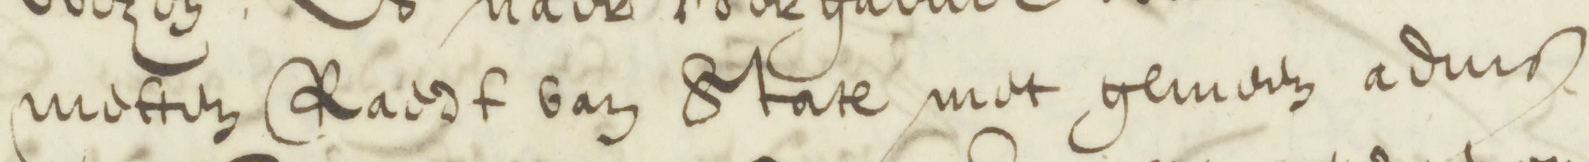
metten Raedt van State met gemeen aduis
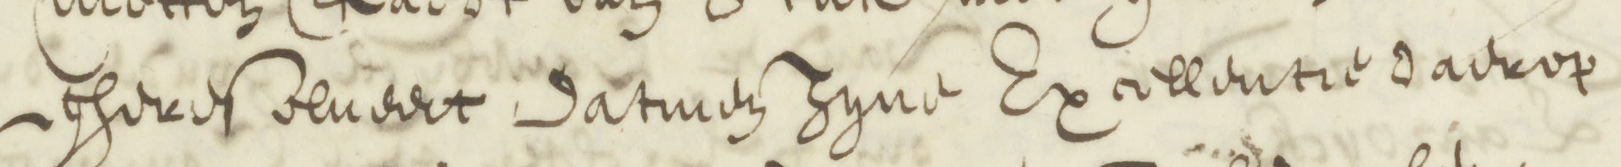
gheresolueert, datmen Zyne Excellentie daerop
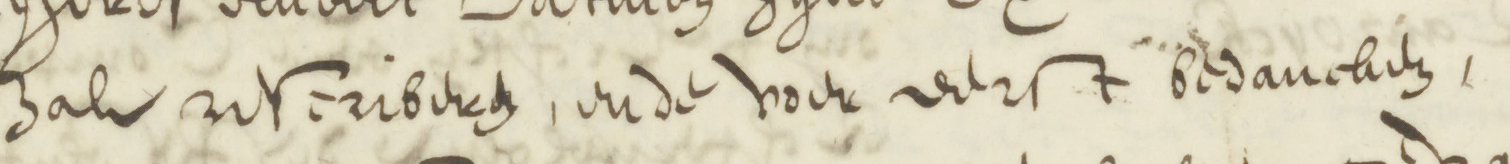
zal rescriberen, ende voer eerst bedancken,
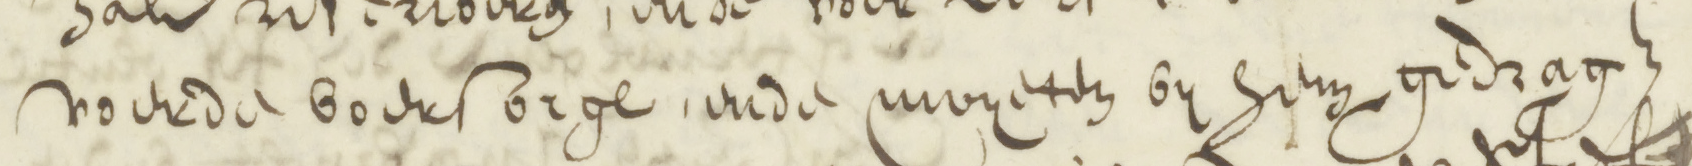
voerde voersorge, ende moyeten by hem gedragen,
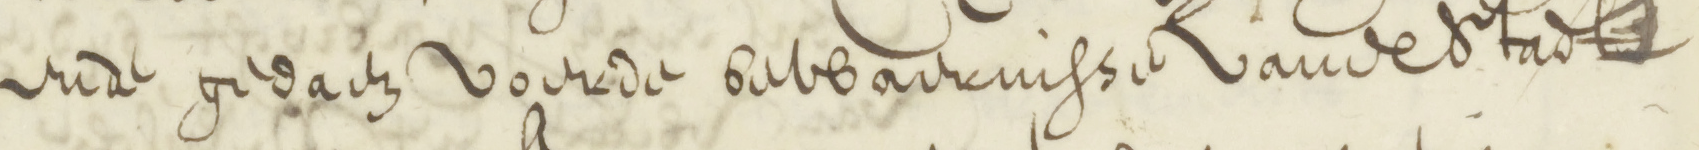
ende gedaen voerde bewaernisse vande stadt#
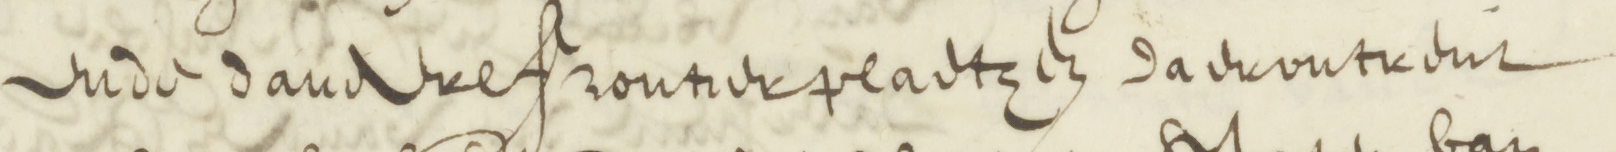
ende dandere frontierplaetzen daerontrent
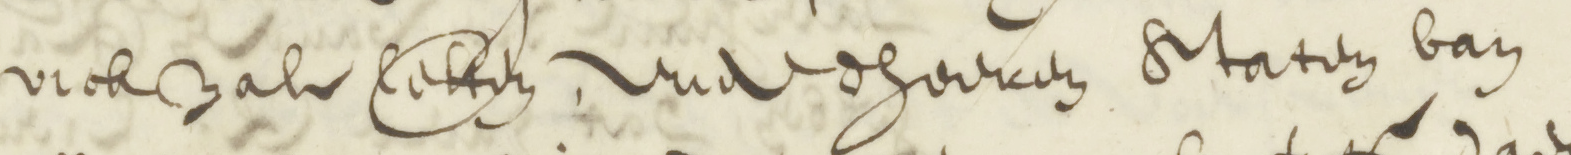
oick zal letten, ende dheeren Staten van
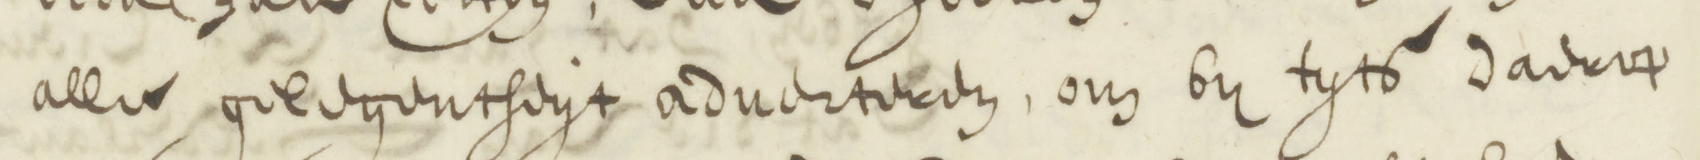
alle gelegentheijt aduerteren, om by tyts daerop
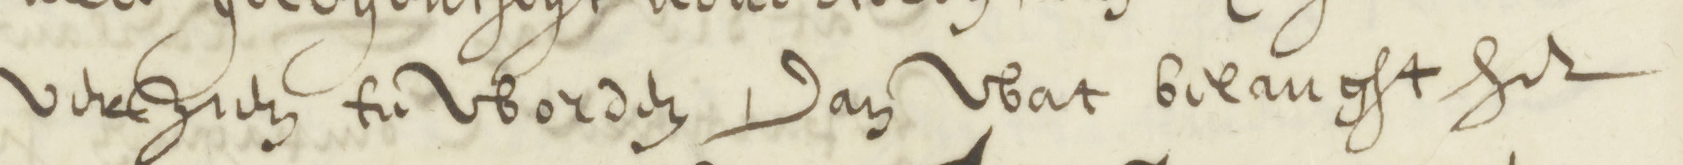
verzien te worden, dan wat belanght het
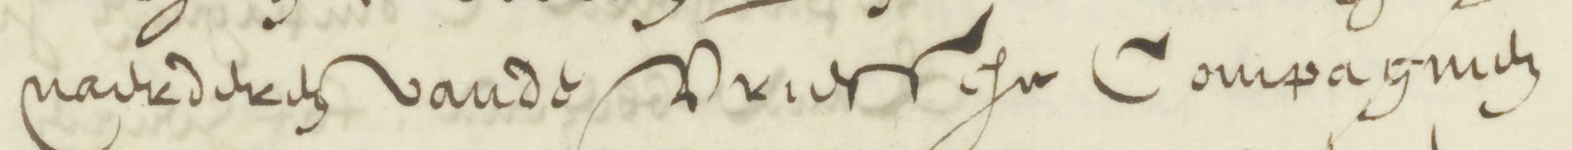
naerderen vande Vriessche Compagnien
